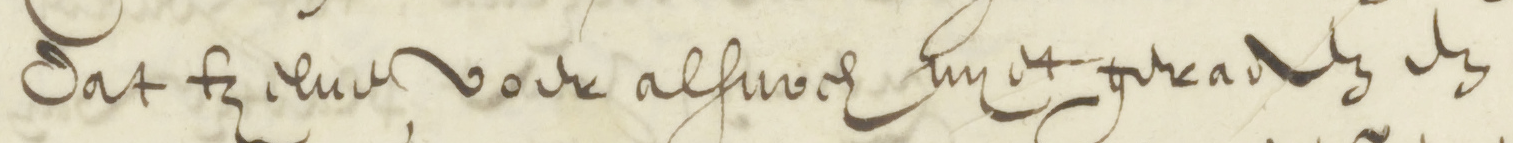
dat tzelue voer alsnoch nyet geraden en
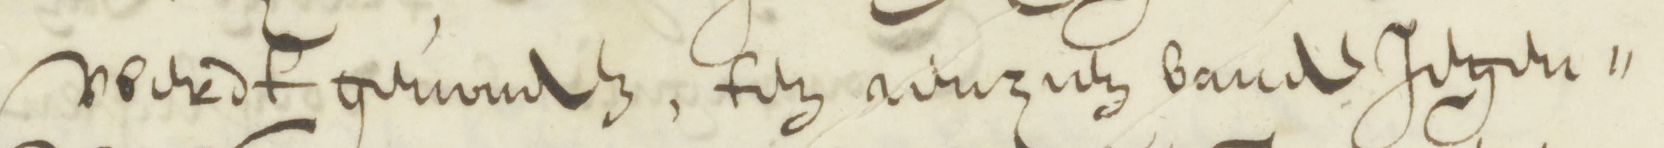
werdt geuonden, ten aenzien vande Jegen„
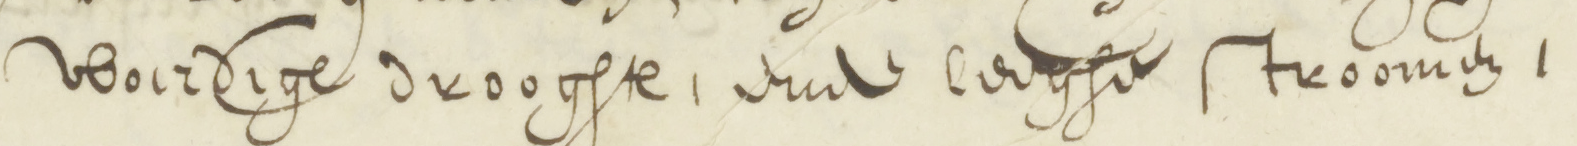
woirdige drooghte, ende leeghe stroomen
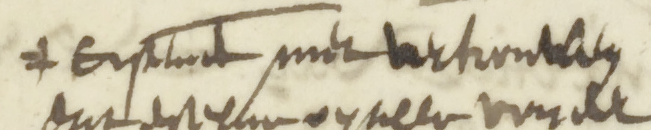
# Oistende met vertrouwen
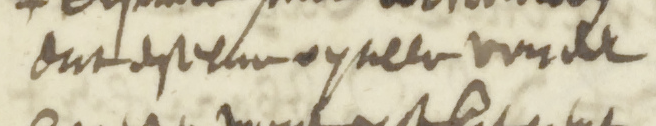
dat deselue op alle voirdere
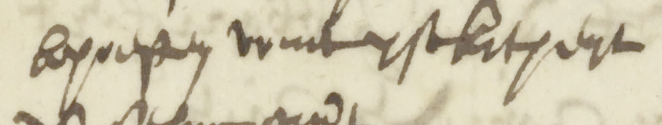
behoeften voer de versekertheyt
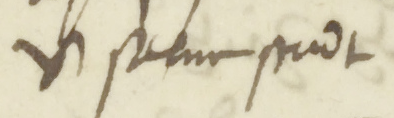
de seluer stadt
